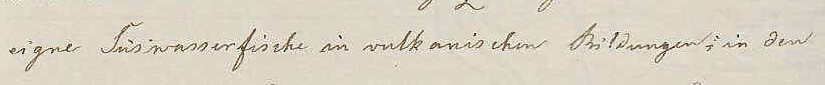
eigne Süswasserfische in vulkanischen Bildungen; in den
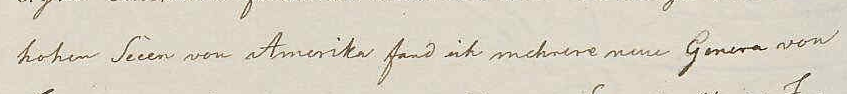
hohen Seeen von Amerika fand ich mehrere neue Genera von
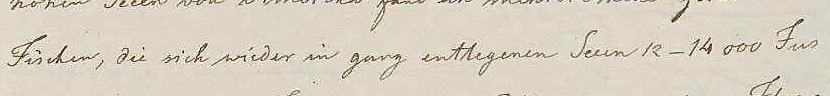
Fischen, die sich wieder in ganz entlegene Seeen 12–14000 Fus
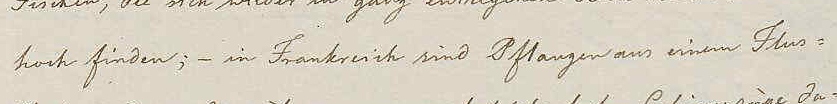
hoch finden; – in Frankreich sind Pflanzen aus einem Flus-
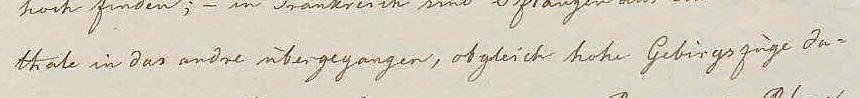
thale in das andre übergegangen, obgleich hohe Gebirgszüge da-
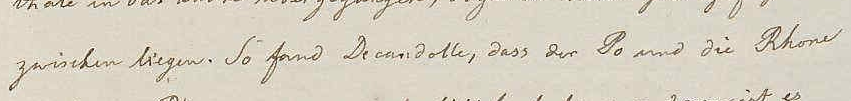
zwischen liegen. So fand Decandolle, dass der Po und die Rhone
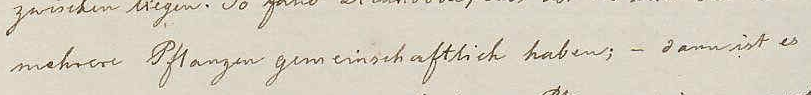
mehrere Pflanzen gemeinschaftlich haben; – dann ist es
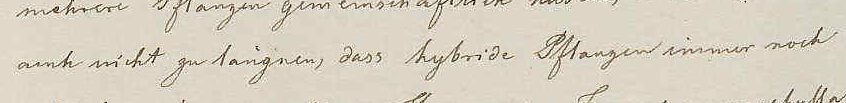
auch nicht zu läugnen, dass hybride Pflanzen immer noch
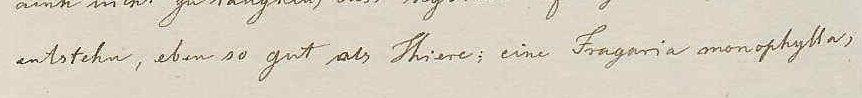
entstehn, eben so gut als Thiere;: eine Fragaria monophylla,
